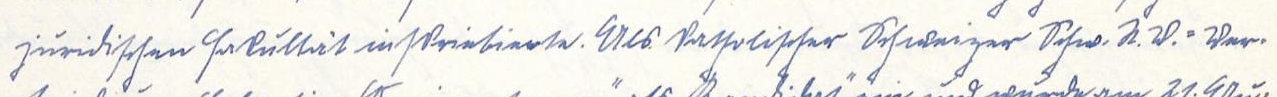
juridischen Fakultät inskribierte. Als katholischer Schweizer Schw. St V-Ver-
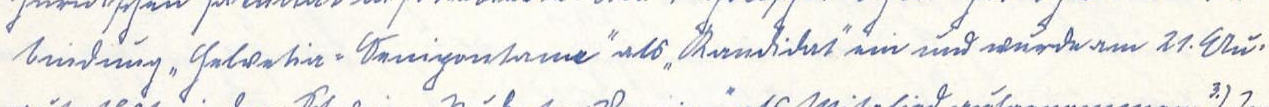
bindung "Helvetia-Semipontana“ als „Kandidat" ein und wurde am 21. Au-
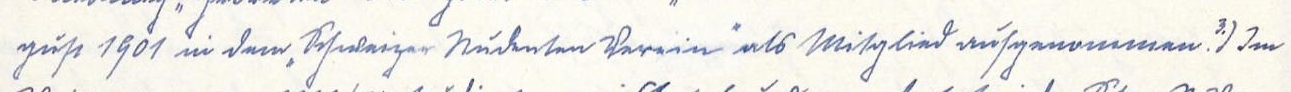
gust 1901 in dem "Schweize Studenten Verein" als Mitglied aufgenommen 3.) Im
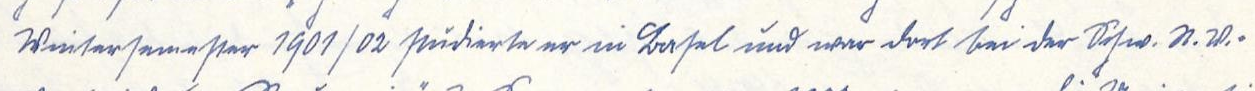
Wintersemester 1901/02 studierte er in Basel und war dort bei der Schw. St. V.-
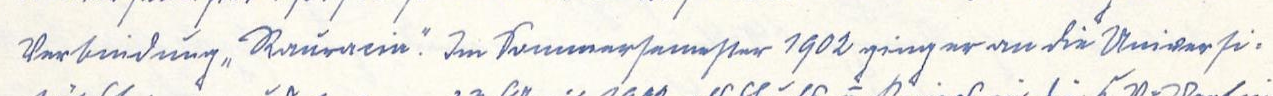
Verbindung "Rauracia". Im Sommersemester 1902 ging er an die Universi-
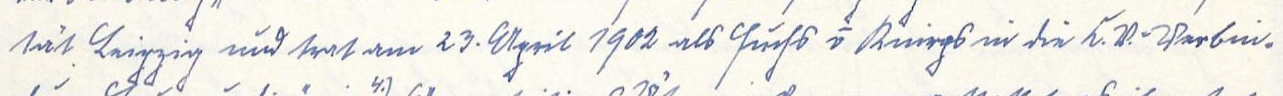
tät Leipzig und trat am 23. April 1902 als Fuchs v/o Knirps in die CV-Verbin-
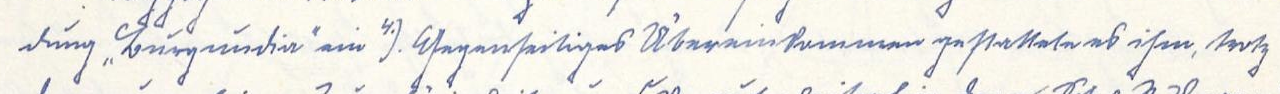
dung "Burgundia“ ein 4). Gegenseitiges Übereinkommen gestattete es ihm, trotz
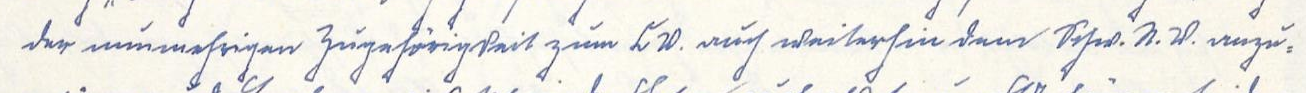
der nunmehrigen Zugehörigkeit zum CV auch weiterhin dem Schw. St. V. anzu-
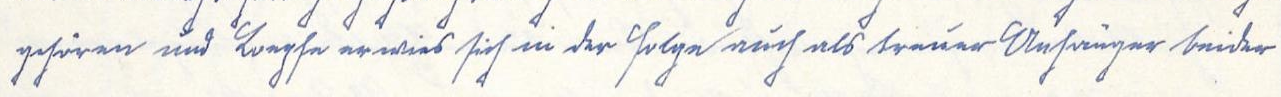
gehören und Loepfe erwies sich in der Folge anch als treuer Anhänger beider
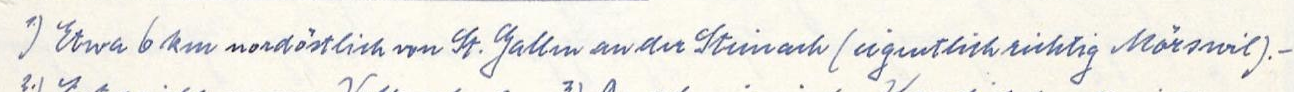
1) Ewa 6 km nordöstlich von St. Gallen an der Steinach (eigentlich richlig Mörswil).-
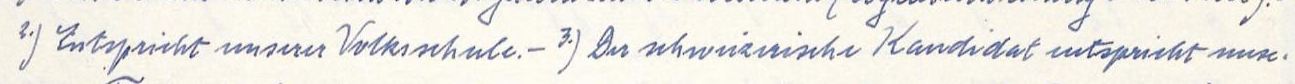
2) Entspricht unserer Volksschule.- 3) Der schweizerische Kandidat entspricht unse-
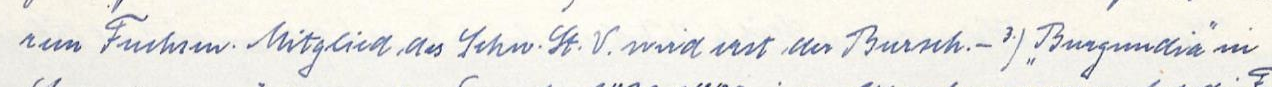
rem Fuchsen. Mitglied des Schw. St. V wird erst der Bursch. 2) "Burgundia" in
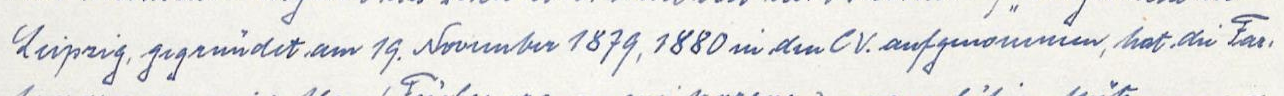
Leipzig, gegründet am 19. November 1879, 1880 in den CV aufgenommmen, hat die Far-
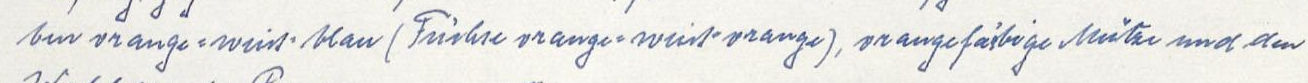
ben orange-weiss- blau (Füchse orange- weiß - orange), orangefärbige Mütze und den
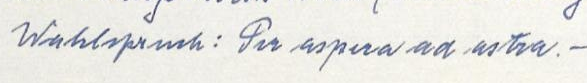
Wahlspruch: Per aspera ad astra. -
